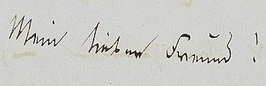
Mein lieber Freund!
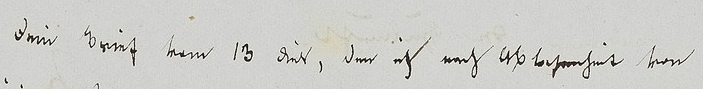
Dein Brief vom 13 dies , den ich nach Abwesenheit von
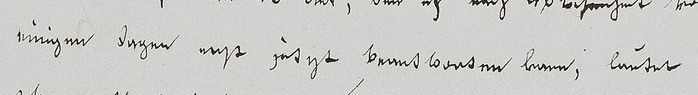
einigen Tagen erst jetzt beantworten kann, lautet
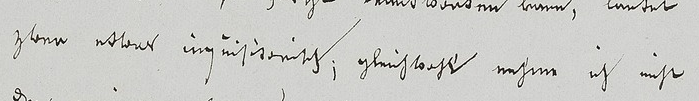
zwar etwas inquisitorisch; gleichwohl nehme ich nicht
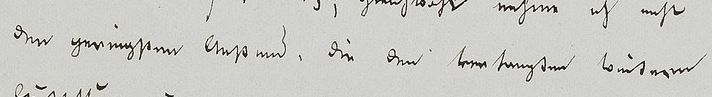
den geringsten Anstand, dir den verlangten weitern
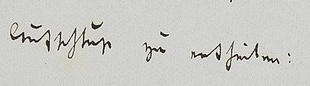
Aufschluß zu ertheilen:
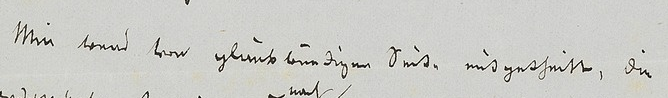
Mir ward von glaubwürdiger Seite mitgetheilt, die
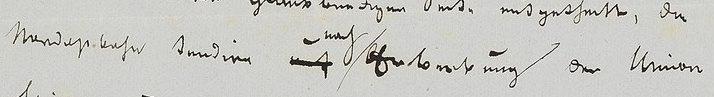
Nordostbahn tendire aufnach Erwerbung der Union
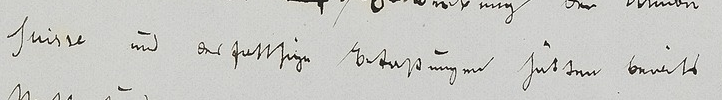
Suisse und desfallsige Betastungen hätten bereits
